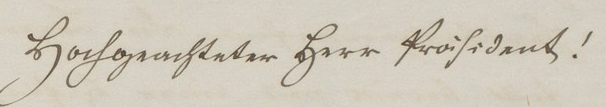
Hochgeachteter Herr Präsident!
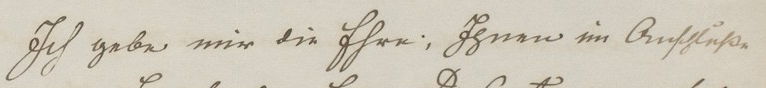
Ich gebe mir die Ehre; Ihnen im Anschluße
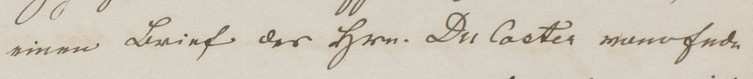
einen Brief des Hrn. Du Coster vom Ende
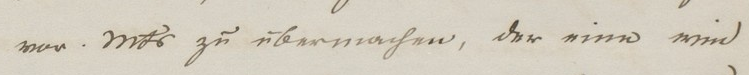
vor. Mts zu übermachen, der eine wie
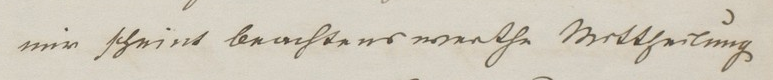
mir scheint beachtenswerthe Mittheilung
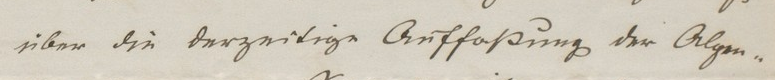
über die derzeitige Auffaßung der Alpen -
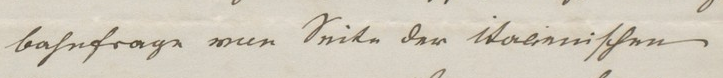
bahfrage von Seite der italienischen
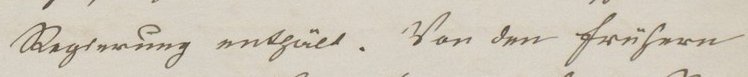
Regierung enthält. Von den frühern
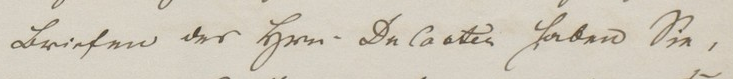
Briefen des Hrn. Du Coster haben Sie,
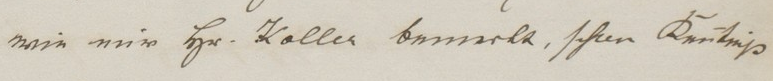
wie mir Hr. Koller bemerkt, schon Kenntniß
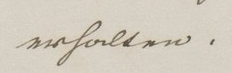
erhalten. –
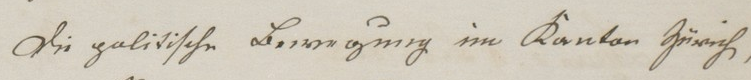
Die politische Bewegung im Kanton Zürich,
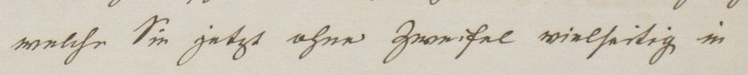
welche Sie jetzt ohne Zweifel vielseitig in
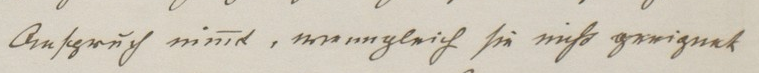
Anspruch nimmt, wenngleich sie nicht geeignet
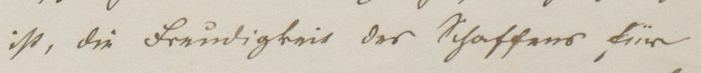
ist, die Freudigkeit des Schaffens für
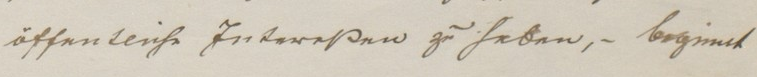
öffentliche Interreßen zu haben,– beginnt
